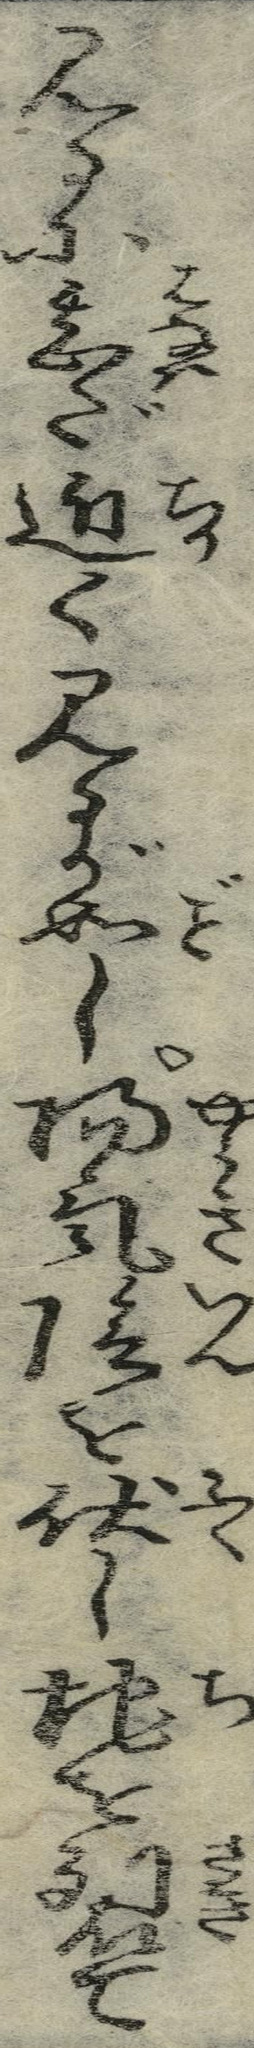見るに甚だ近く見るが如し。陽気陰を伏し地を裂て
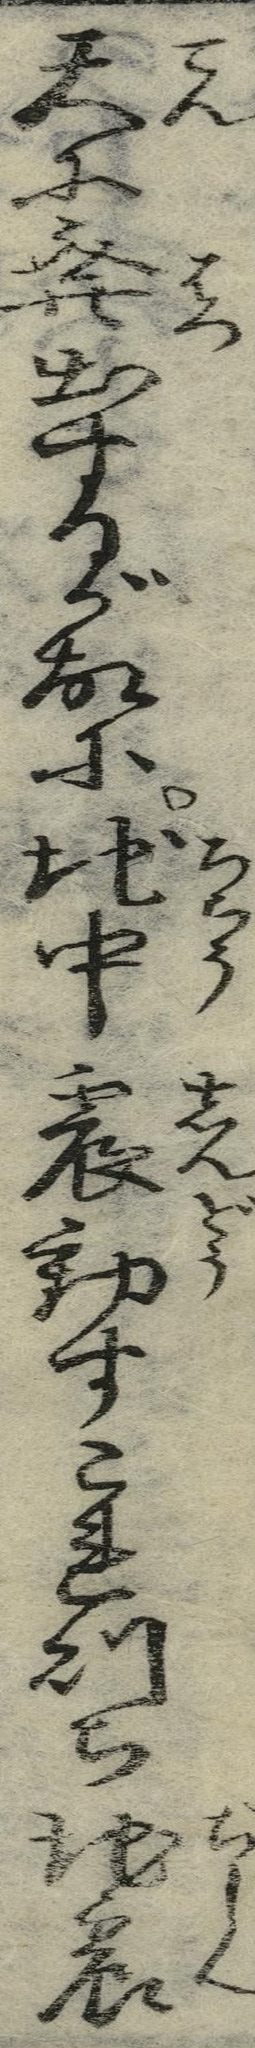天に発出するが故に。地中震動すこれ則ち地震
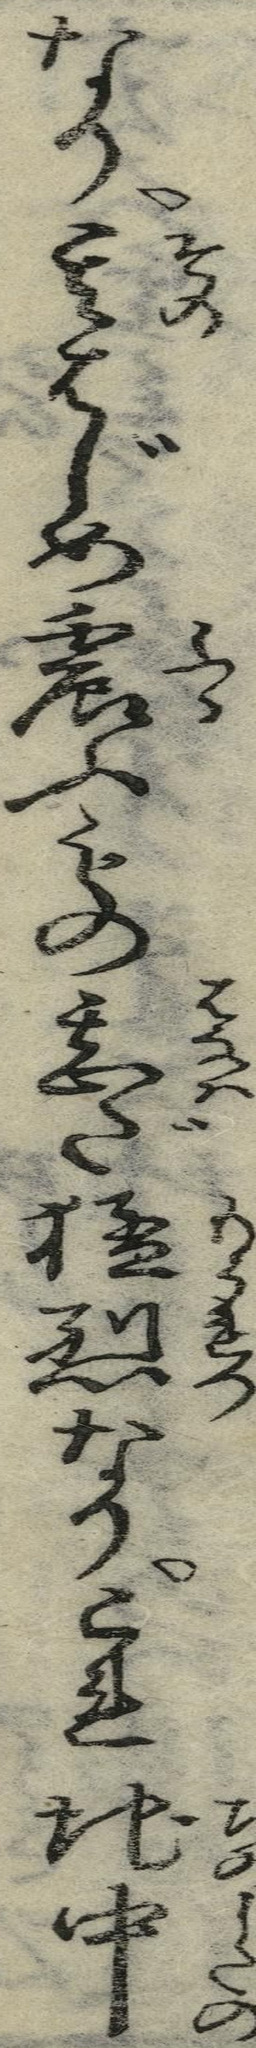なり。其はじめ震ふもの甚だ猛烈なり。これ地中
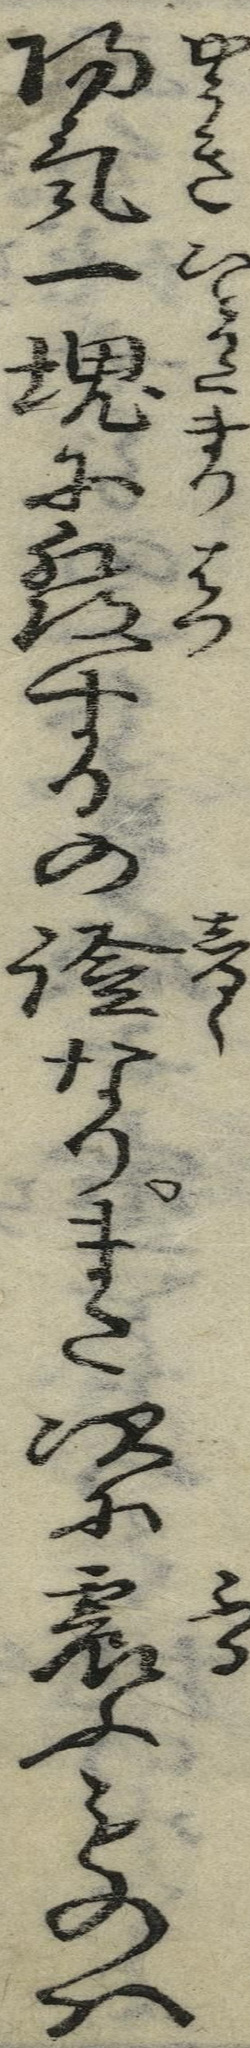陽気一塊に発するの証なり。また次に震ふものは
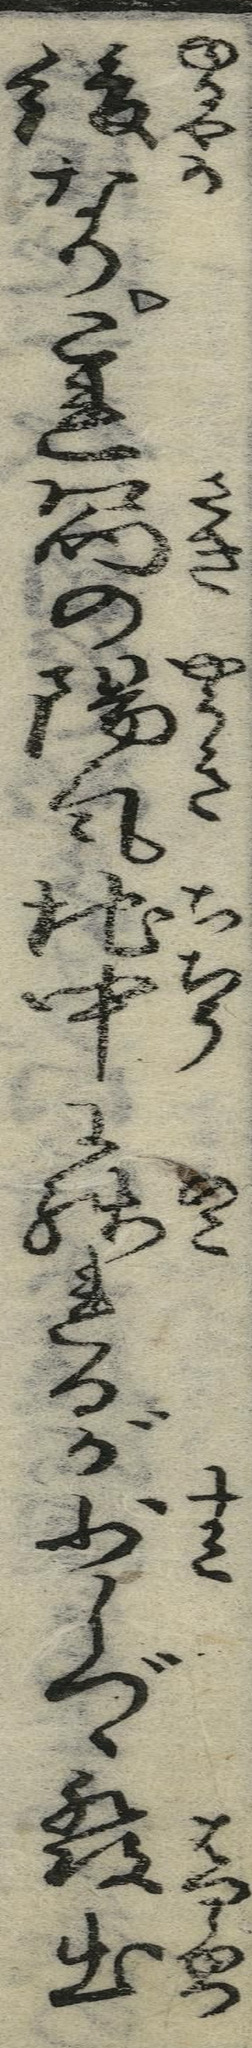緩なり。これ嚮の陽気地中に残れるが少しづゝ発出
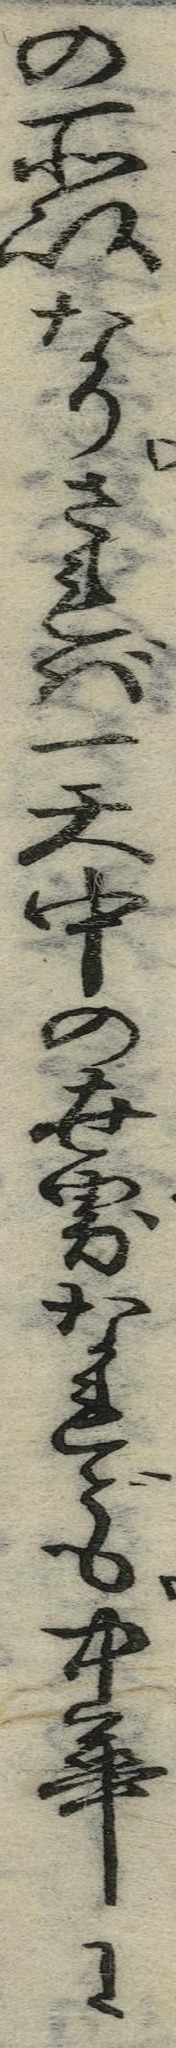の所以なり。されば一天中の世界なれども。中華に
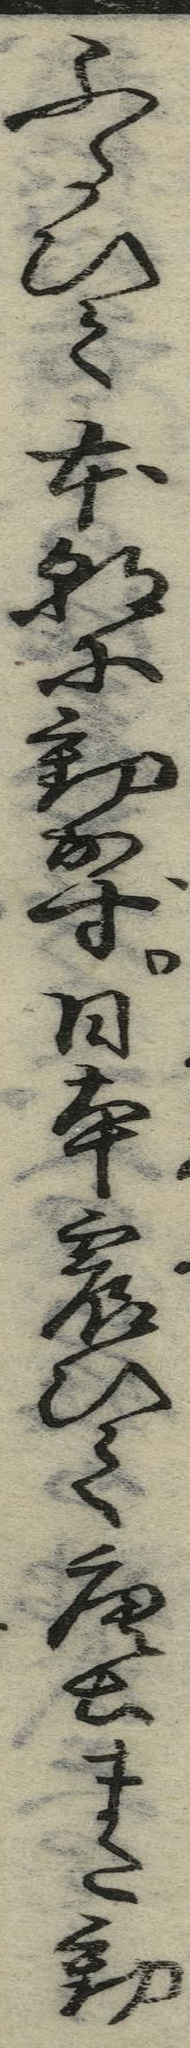ふるひて本朝に動かず。日本震ひて唐土また動
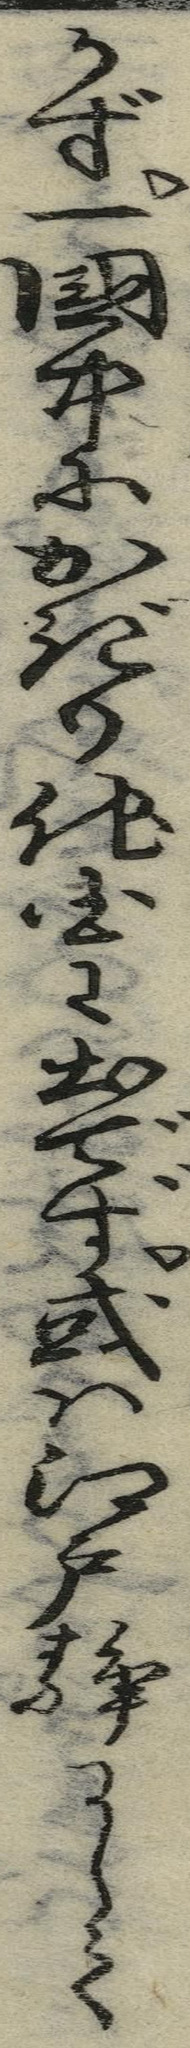かず。一国中にかぎり他国に出でず。或は江戸静にして
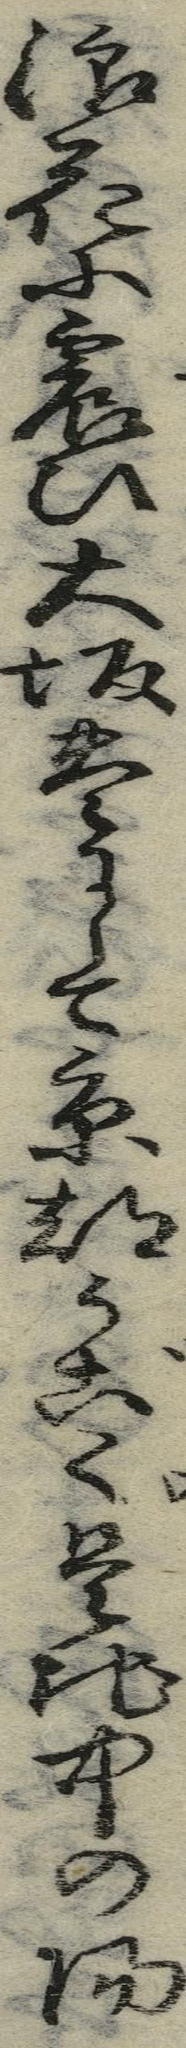浪花に震ひ。大坂豊にして京都うごく。是地中の陽
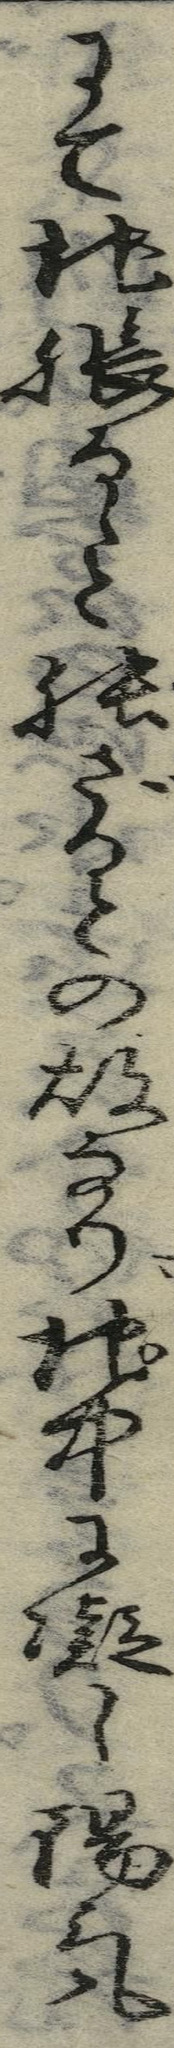にて地脹るゝと脹ざるとの故なり。地中に凝し陽気
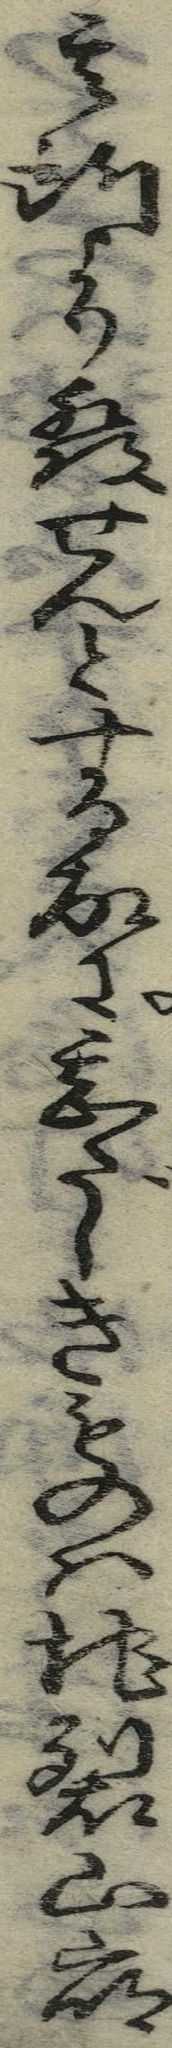其所より発せんとする故に。甚だしきものは地裂山崩
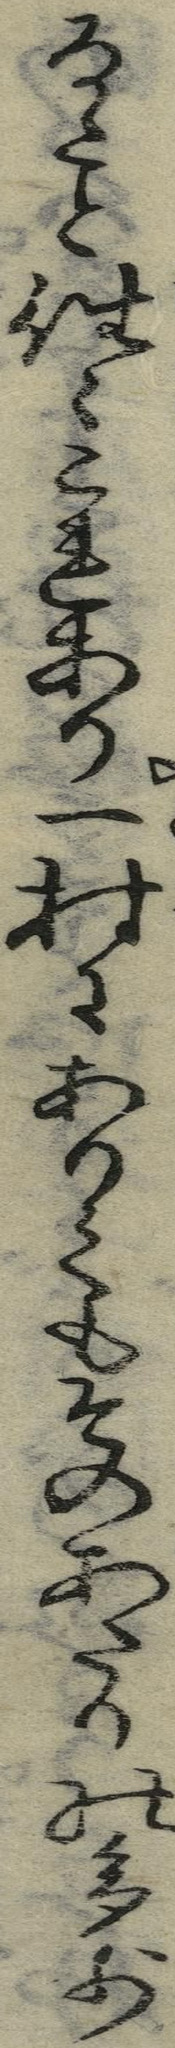るゝこと往々これあり。一村にありてもそのあたりの多少

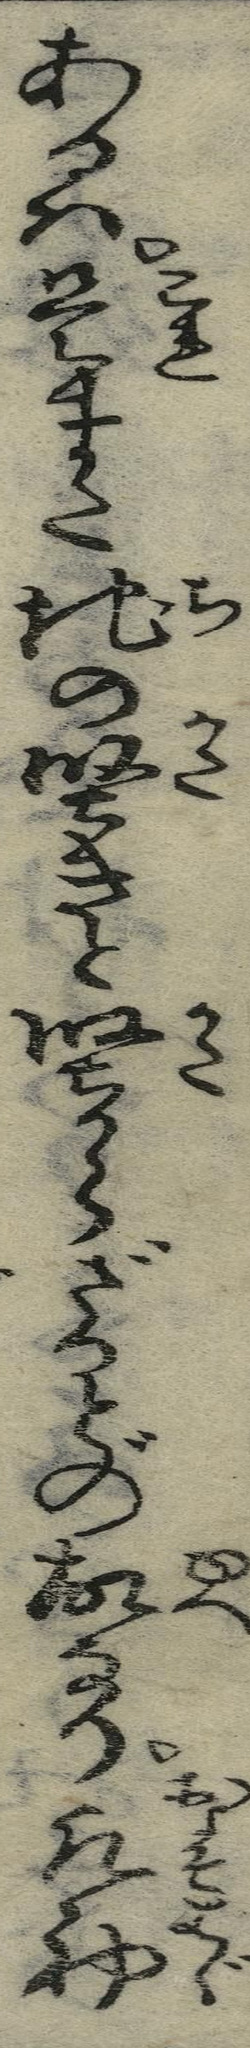あるは。是また地の堅きと堅からざるとが故なり。凡初
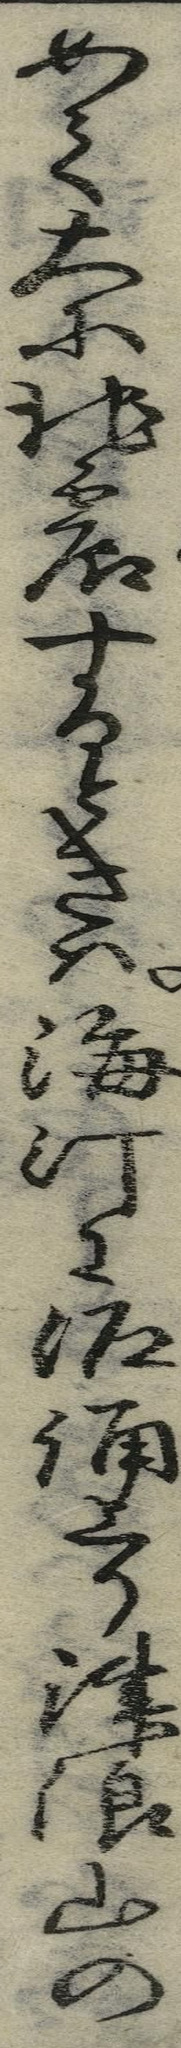めて大に地震するときは。海汀に泥涌上り津浪山の
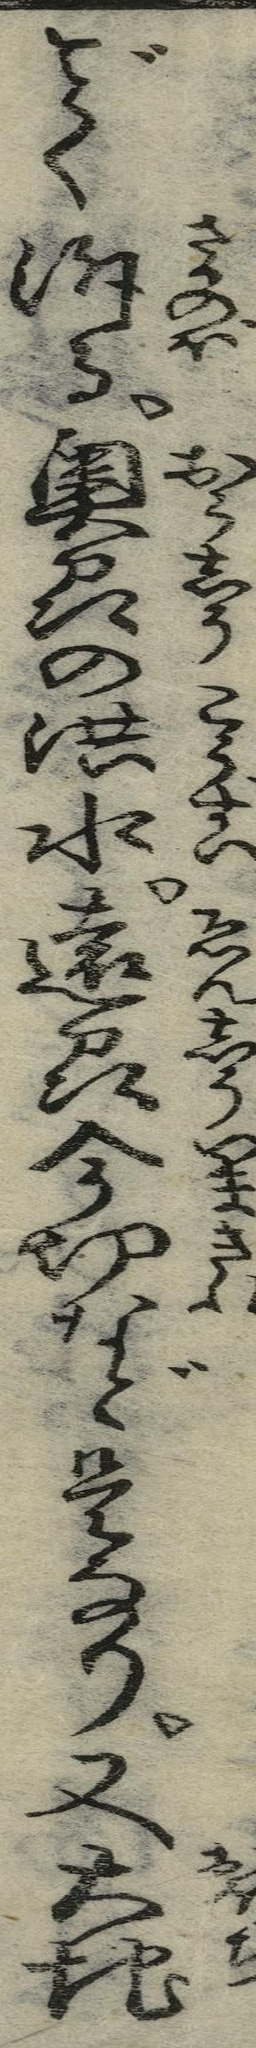どて溯る。奥州の洪水。遠州今切など是なり。又大地
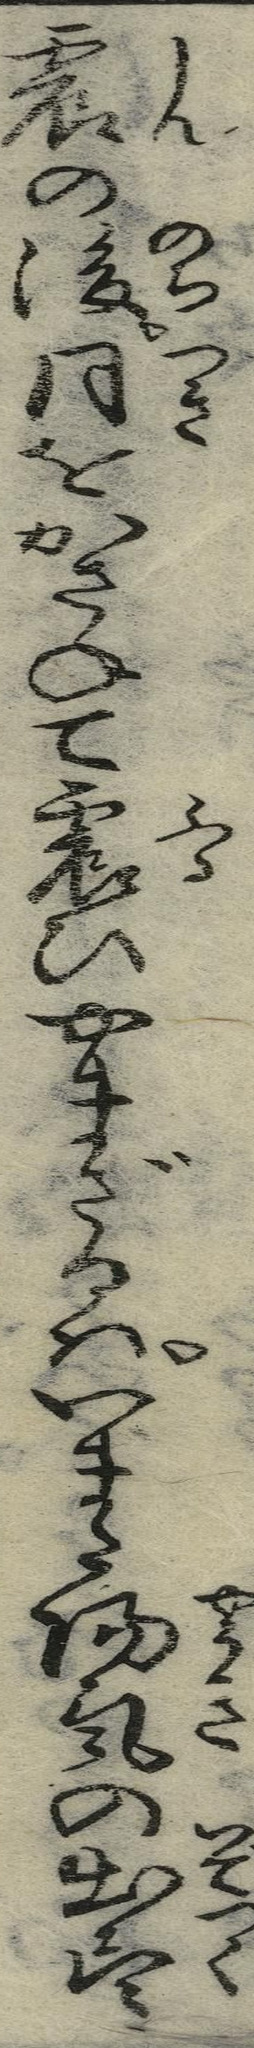震の後。月をかさねて震ひやまざるは。いまた陽気の出尽
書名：本朝地震記　全
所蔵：東京大学地震研究所図書室 Earthquake Research Institute Library, The University of Tokyo, JAPAN
